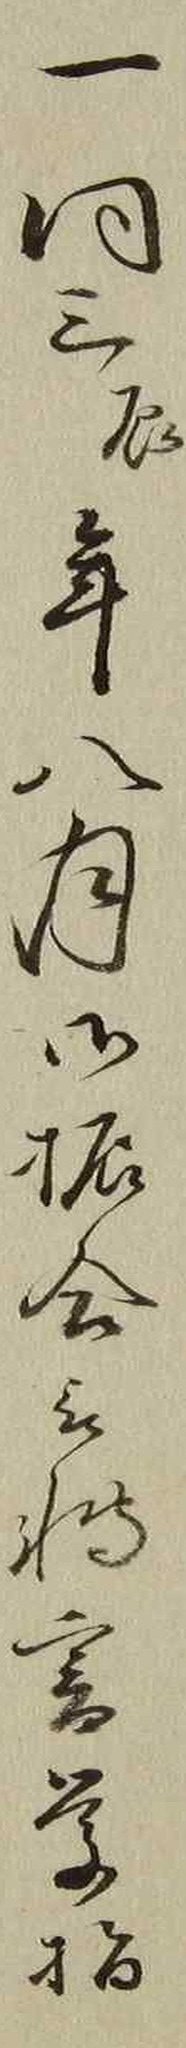一同三辰年八月御振合被転学指
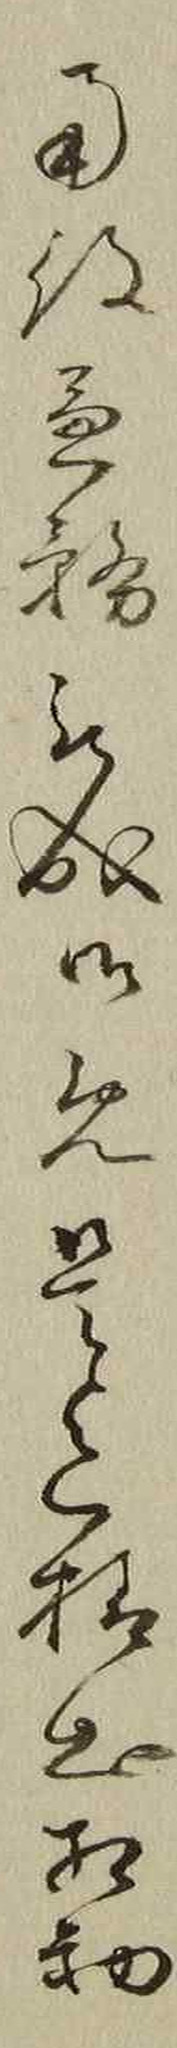南役兼務被成御免是迄精出相勤
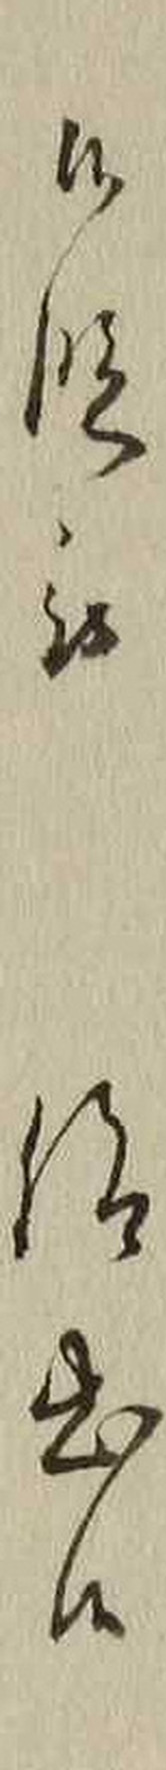候段被仰出候
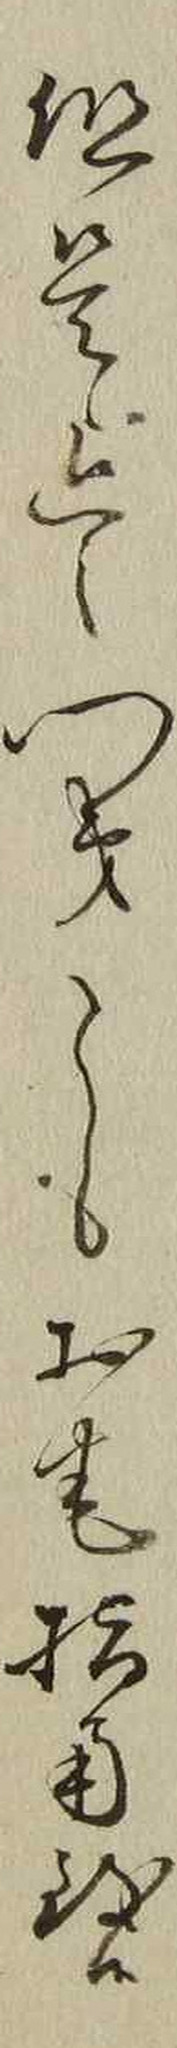但是迄之門弟とも於宅指南致候
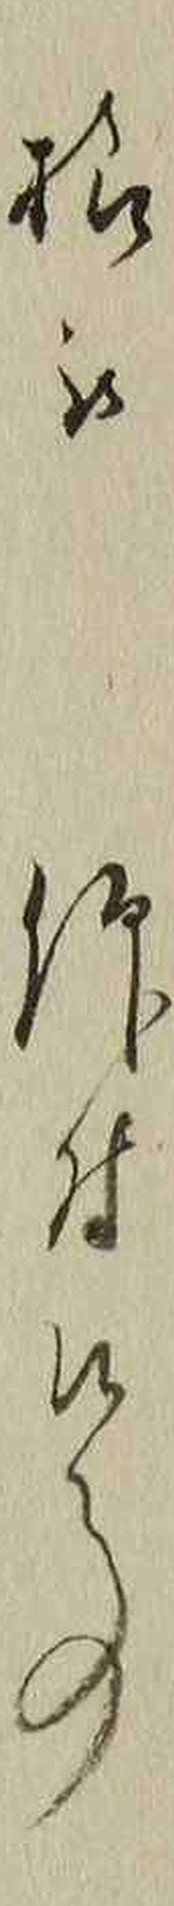様被仰付候事
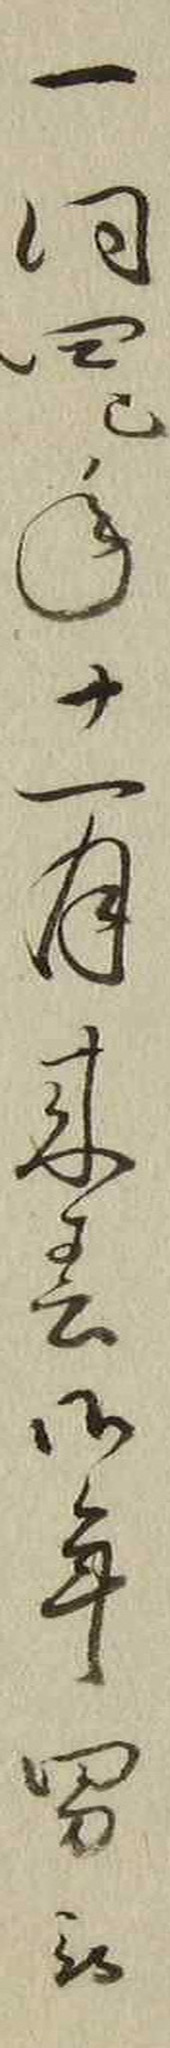一同四巳年十一月来春御年男被
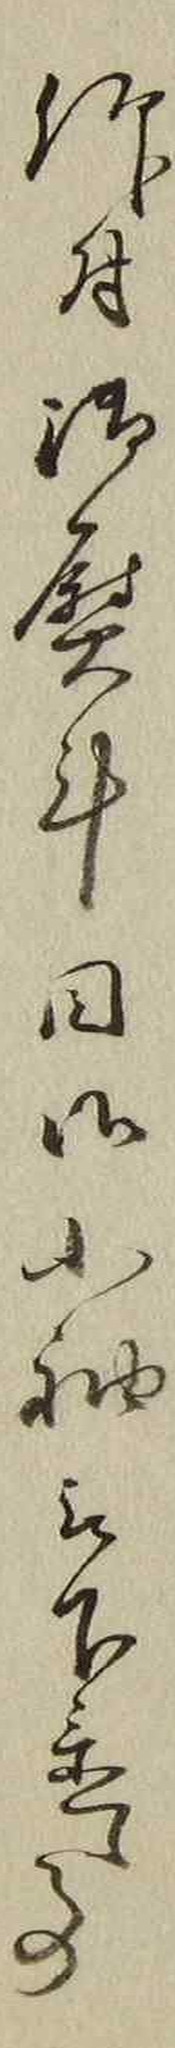仰付御熨斗目御小袖被下置候事
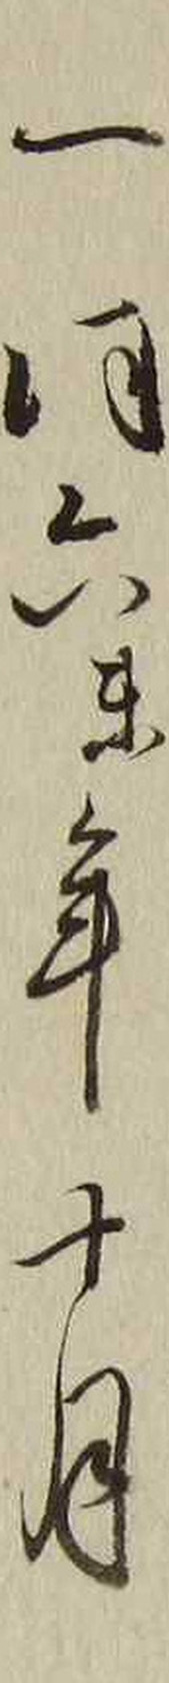一同六未年十月
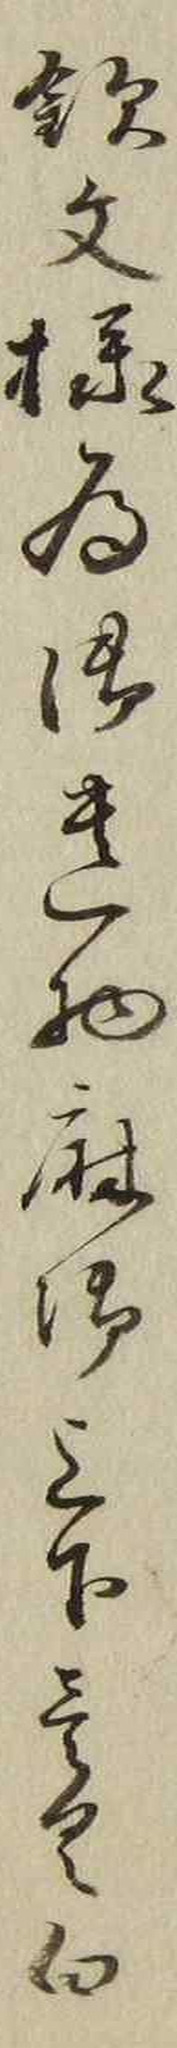欽文様為御遺物麻御上下壱具白
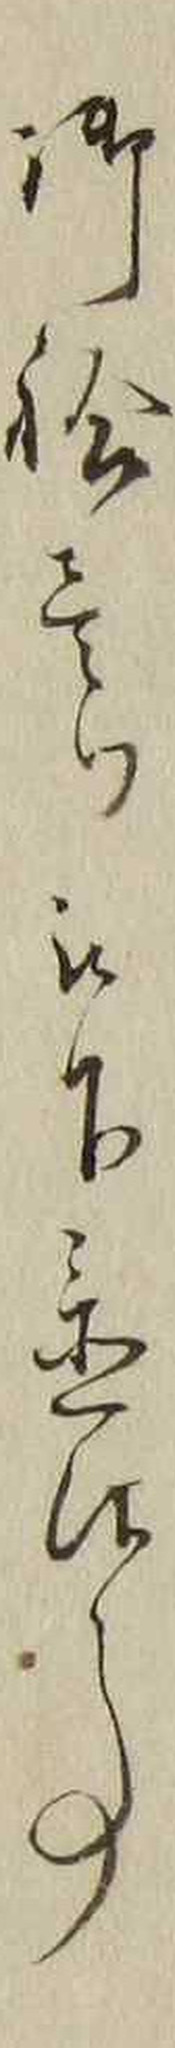御袷壱ツ被下置候事

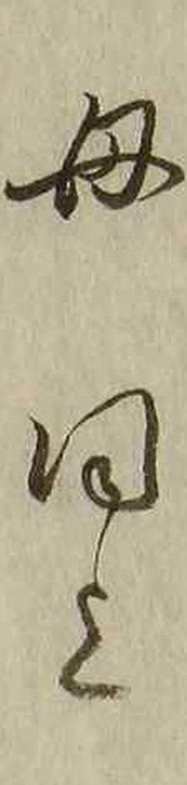母同上
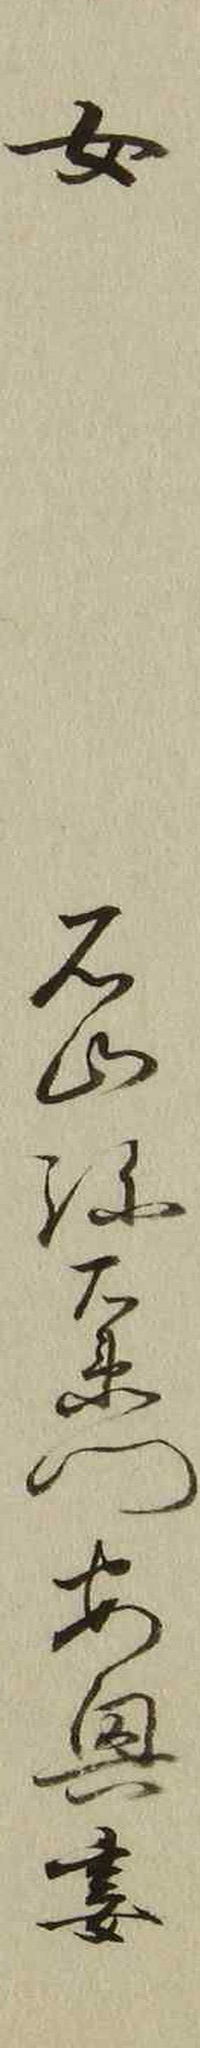女石山弥右衛門安興妻
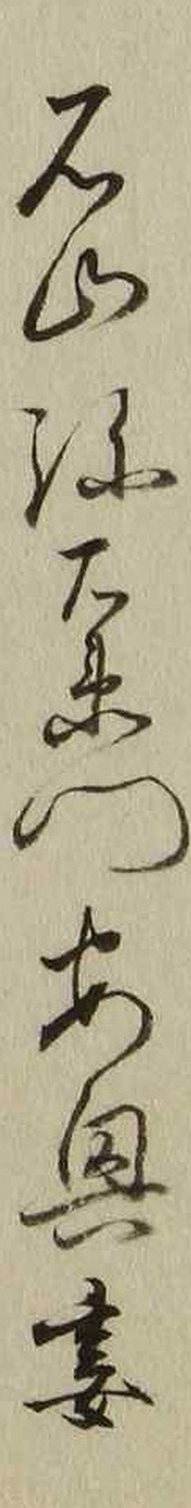女石山弥右衛門安興妻
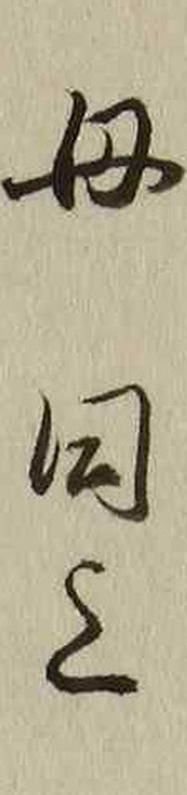母同上
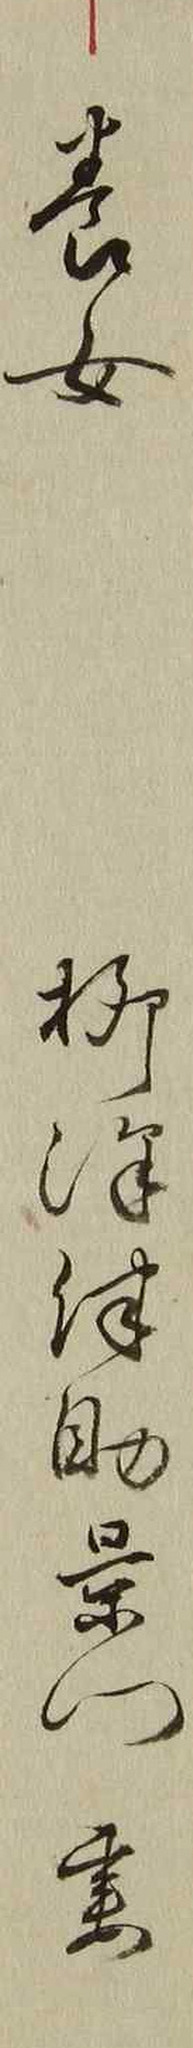養女柳沢伴助景門妻
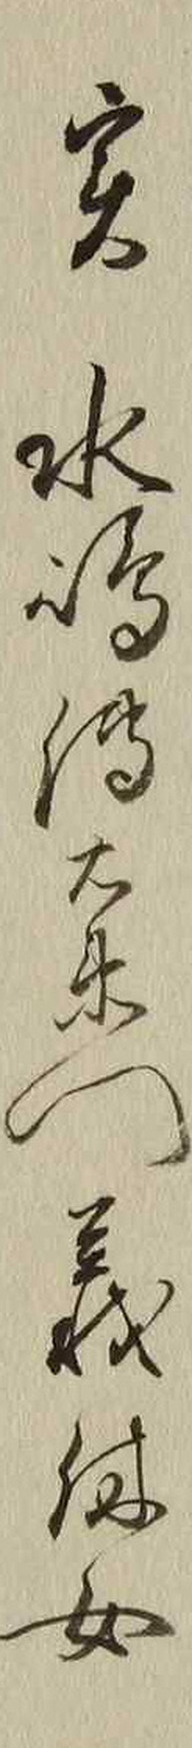実水嶋伝右衛門義休女
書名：諸士系譜　巻之4　い之部4
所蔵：会津若松市立会津図書館
